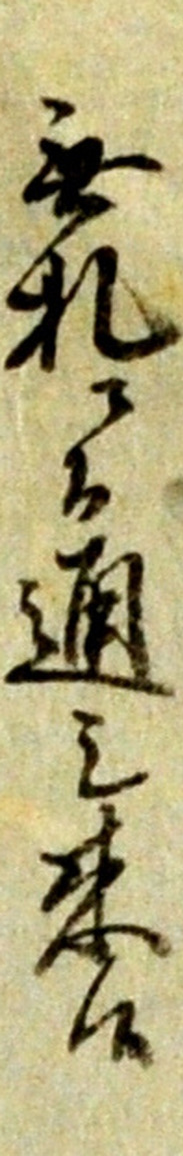無札ニ而通シ来候
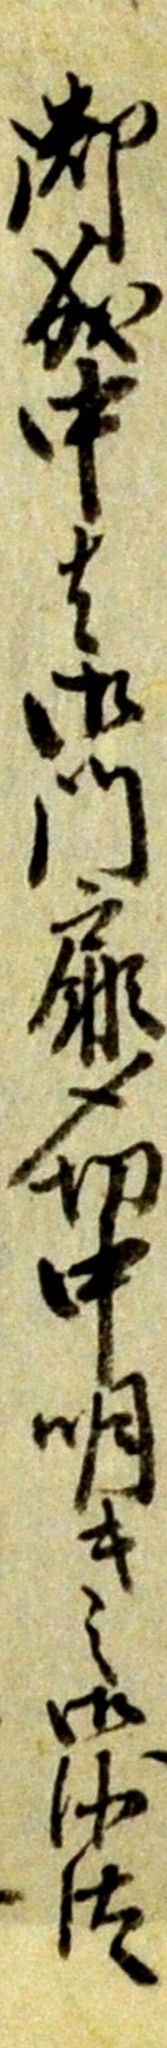御成中者御門扉〆切中明キ之御沙汰
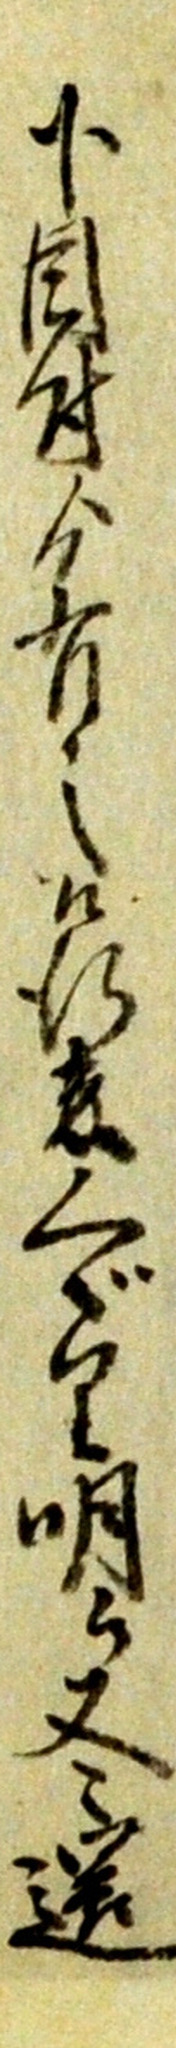下目付ゟ有之候得者くぐり明ケ又々還
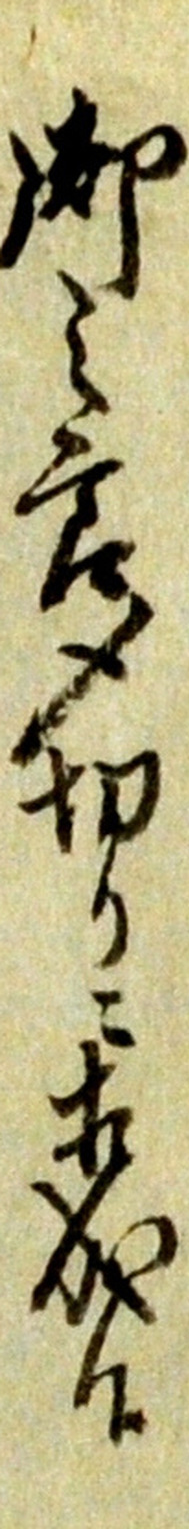御之節〆切りニ相成候
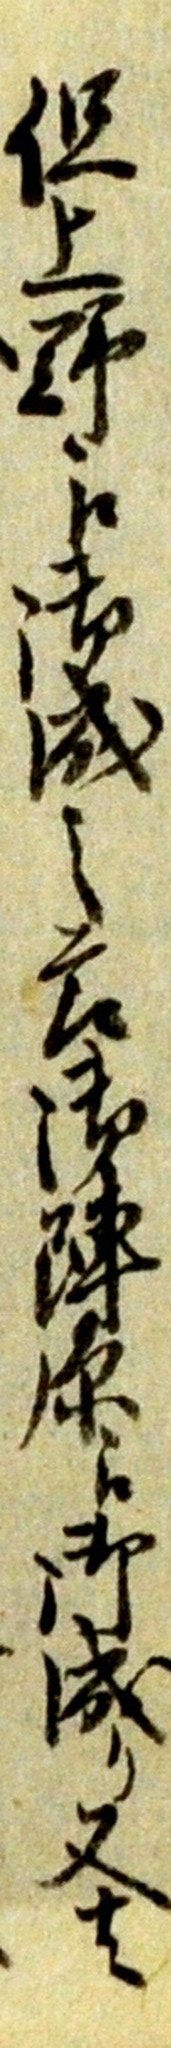但上野江御成之節御陣原江御成り又者
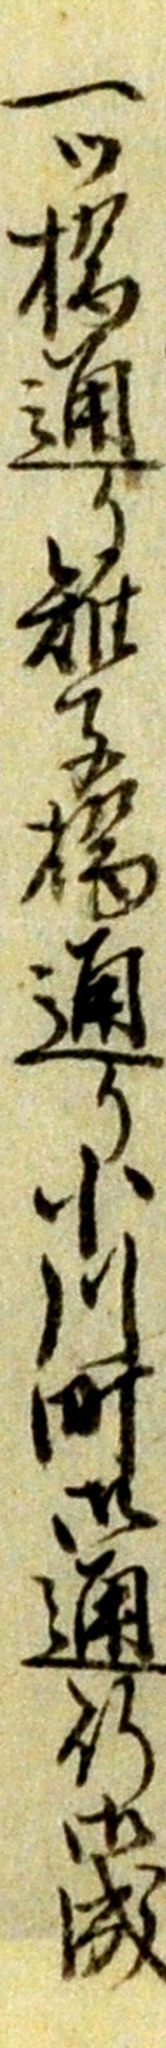一ツ橋通り雉子橋通り小川町御通行御成
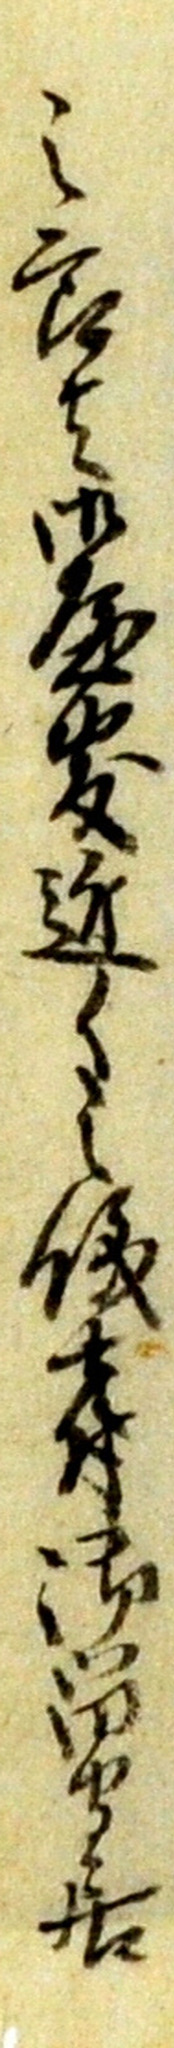之節者御屋敷近く之儀先付御留守居
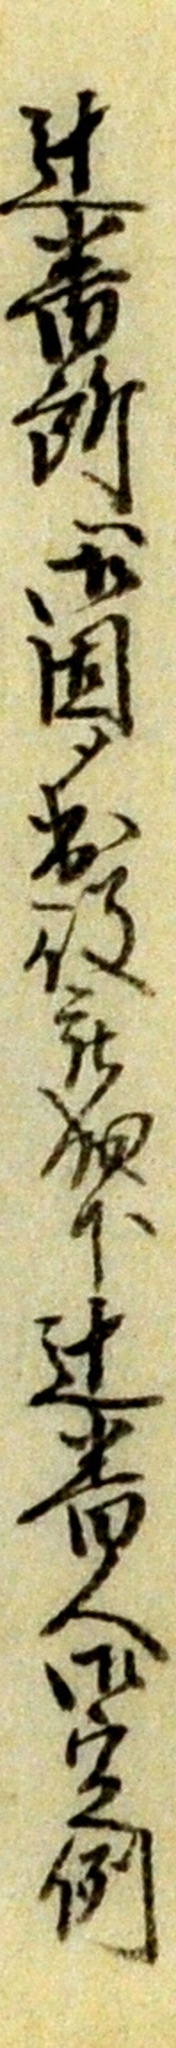辻番所ハ御固メ出役被成下辻番人御定例
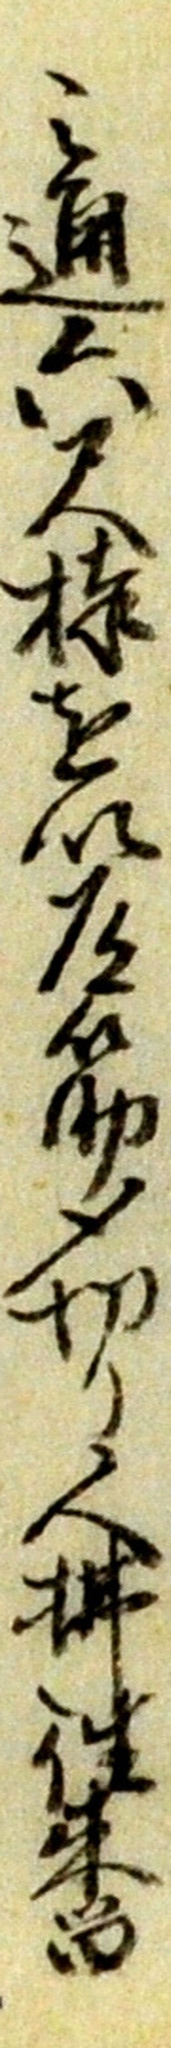之通六尺棒を以道筋〆切り人払往来留
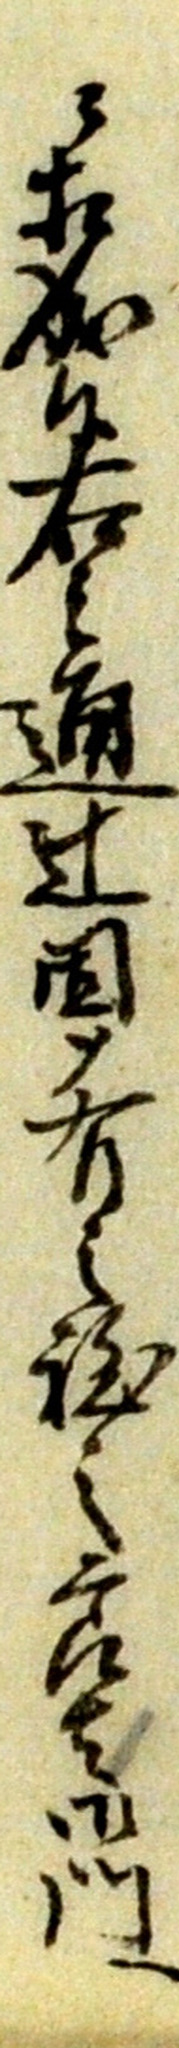ニ相成候右之通辻固メ有之程之節者御門へ
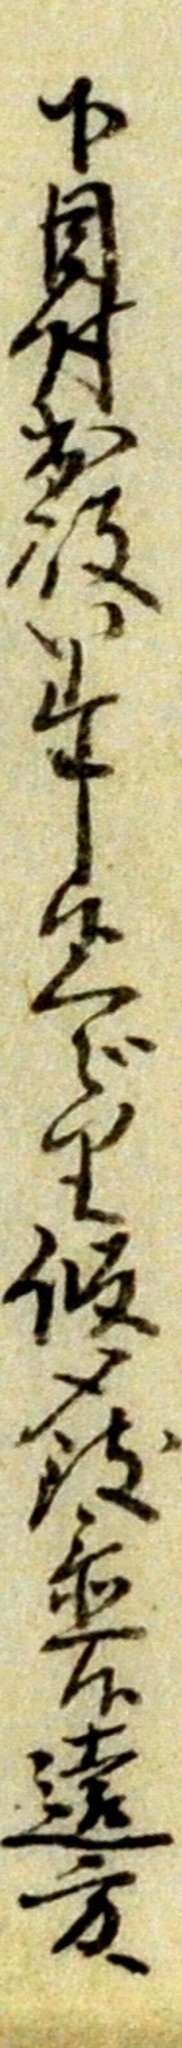下目付出役いたし候くぐり仮〆致置候遠方へ
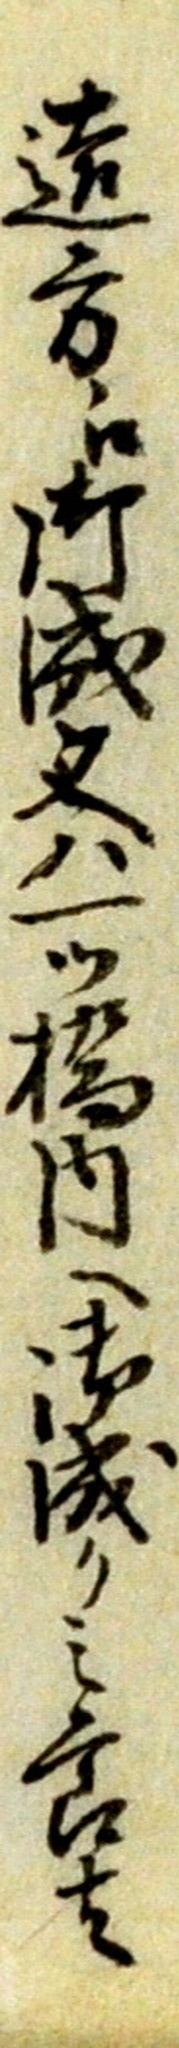遠方江御成又ハ一ツ橋内へ御成り之節者
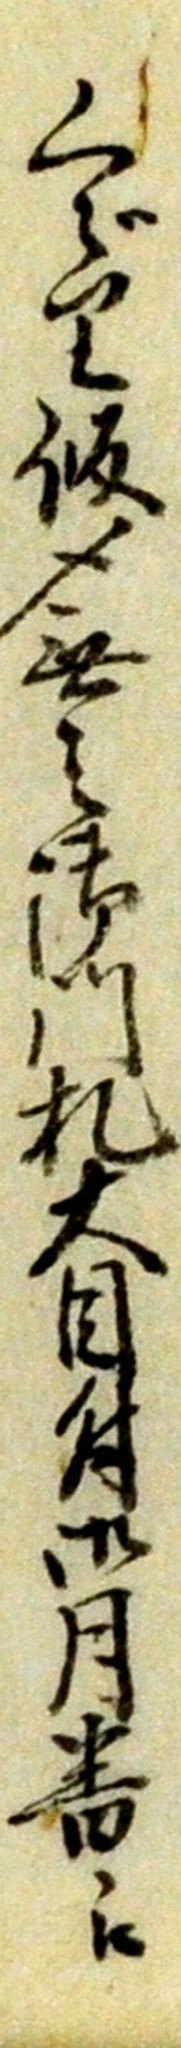くぐり仮〆無之御門札大目付御月番江
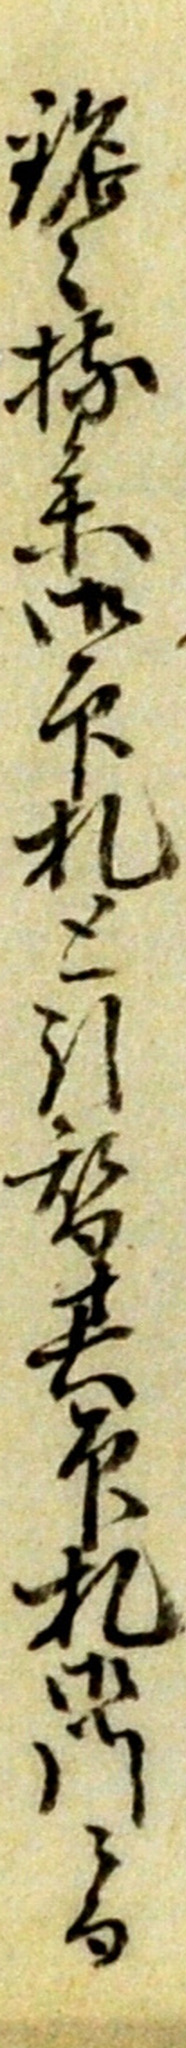銘々持参御印札と引替其印札御門ニ而
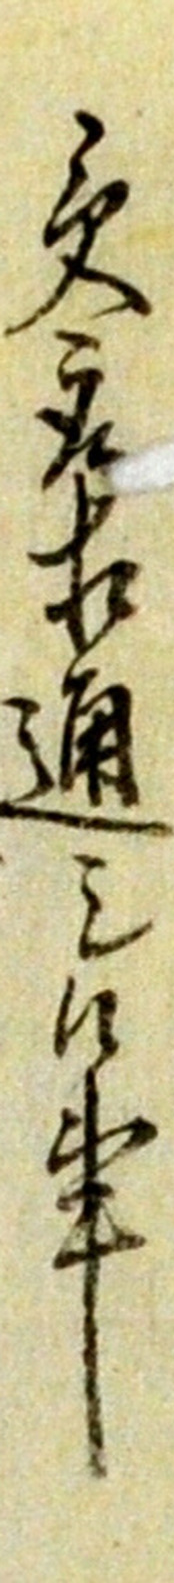受取相通し候事
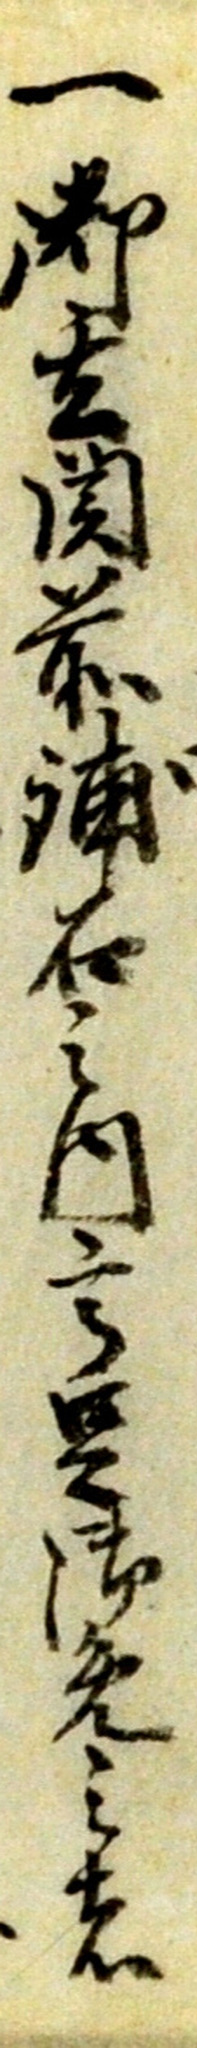一御玄関前鋪石之内高足御免之者
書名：御先手組江戸御屋敷御門番勤方
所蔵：伊那市立高遠町図書館・合同会社AMANE
